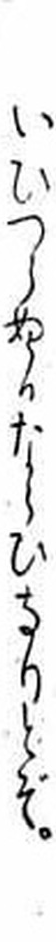いひつらぬるならひなりとぞ。
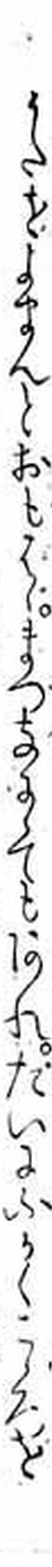うたをよまんとおもはゞ。まづなにゝてもあれ。だいにふかくこゝろを
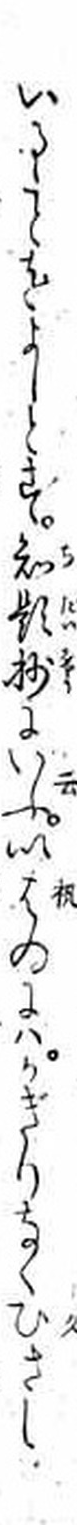いるゝことをよしとす。知題抄にいふ。いはゐには。かぎりなくひさし
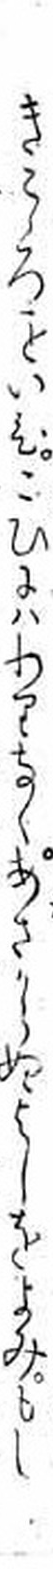きこゝろをいひ。こひにはわりなく。あさからぬよしをよみ。もし
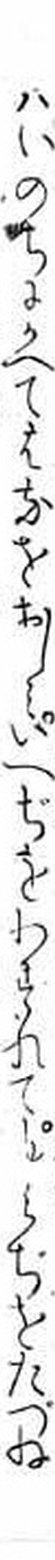はいのちにかへてはなをおしみ。いへぢをわすれて。もみぢをたづね
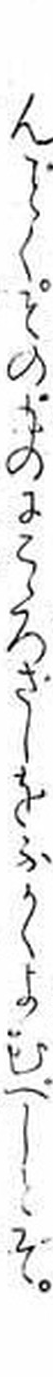んごとく。そのものにこゝろざしをふかくよむべしとぞ。
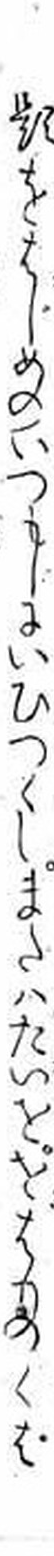題をはじめのいつもじにいひつくし。またはたいを。をはりのくば
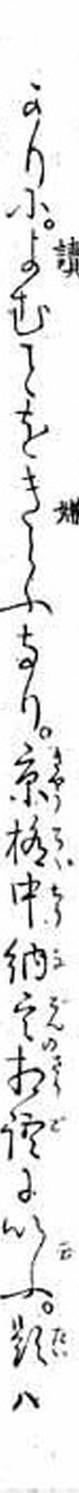かりに。よむことをきらふなり。京極中納言相語にいふ。題は
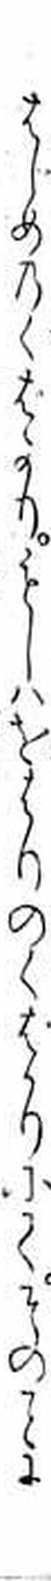はじめのくばかり。もしはをはりのくばかりにて。そのことに
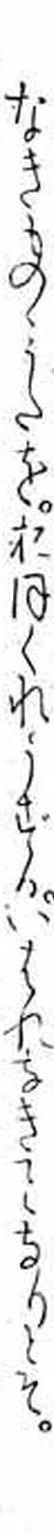なきものゝうたを。おほくれうずる。いはれなきことなりとそ。
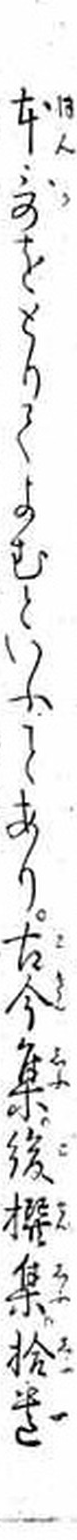本哥をとりてよむといふことあり。古今集。後撰集。拾遺
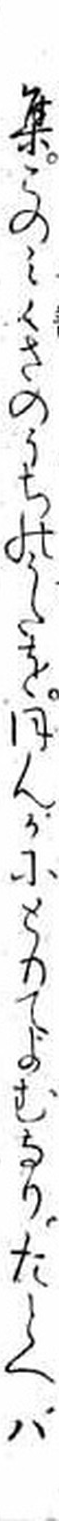集。このみくさのうちのうたを。ほんかにとりてよむなり。たとへば

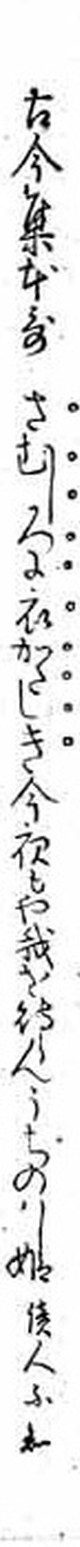古今集本哥さむしろに衣かたしき今夜もや我を待らんうぢのはし姫読人不知
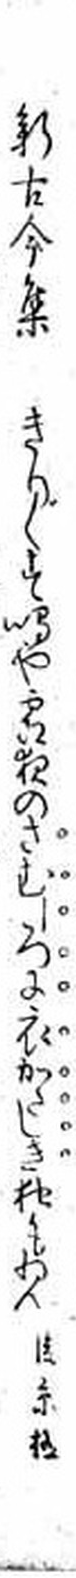新古今集きり〴〵す鳴や霜夜のさむしろに衣かたしき独かもねん後京極
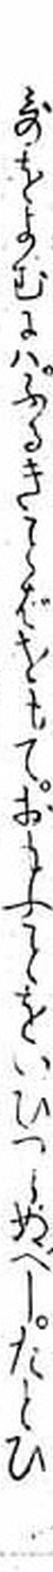哥をよむには。ふるきことばをもて。おもふことをいひつらぬべし。たとひ
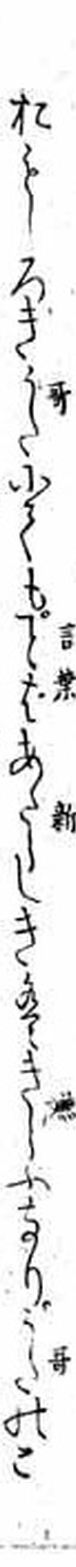おもしろきうたにても。ことばあたらしきはきらふなり。うたのこ
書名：女学範
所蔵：東京学芸大学教育コンテンツアーカイブ
